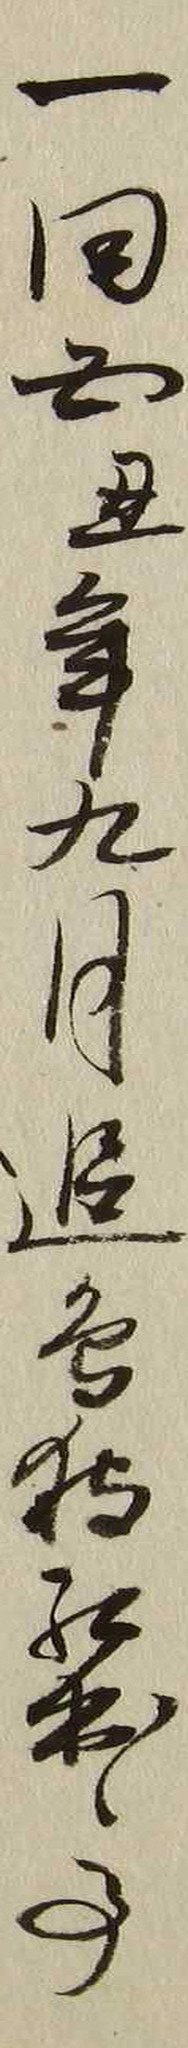一同五丑年九月追鳥狩罷出候事
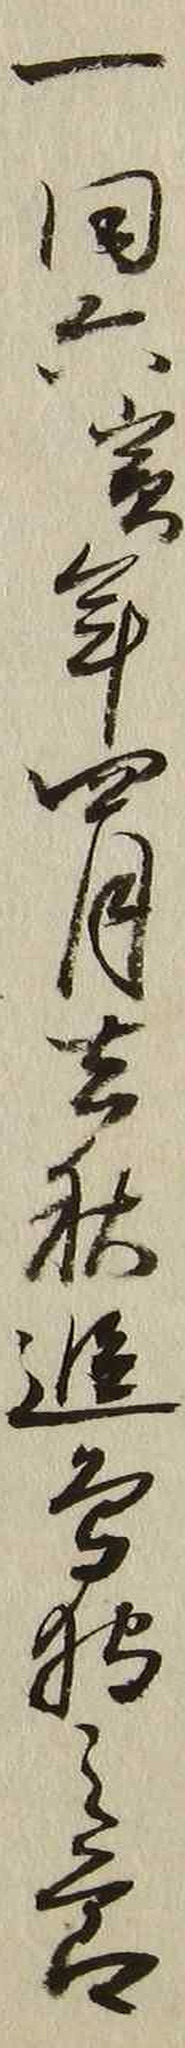一同六寅年四月去秋追鳥狩之節
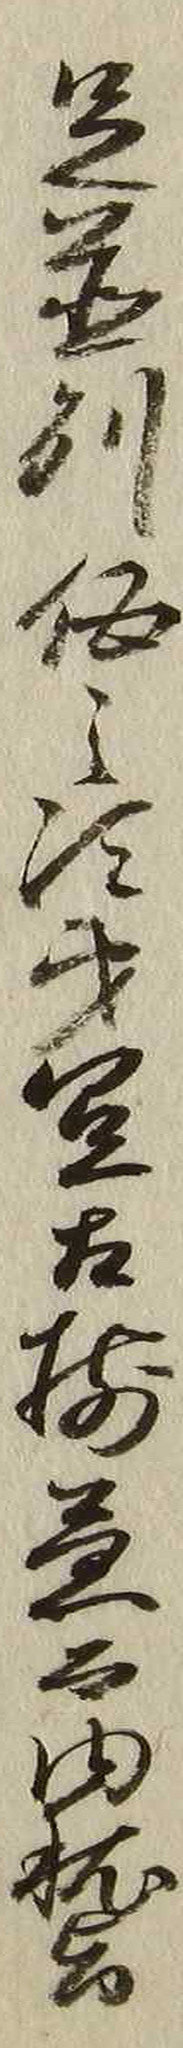足並列伍之次第宜相揃兼而内稽
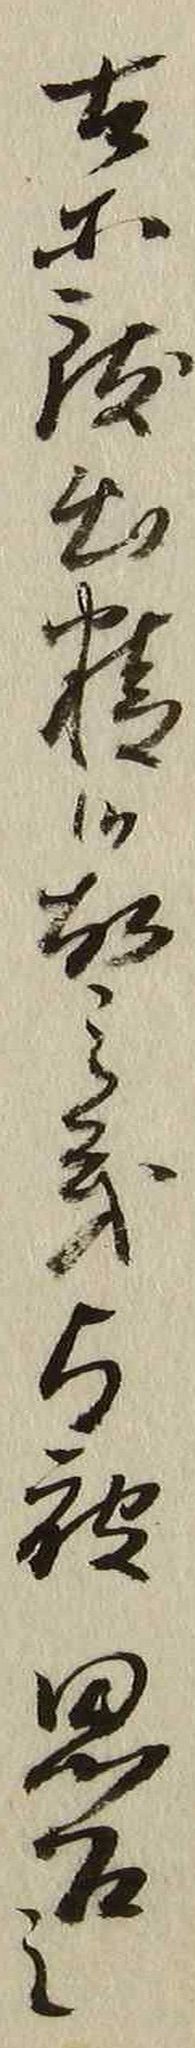古等致出精候故之義与被思召之
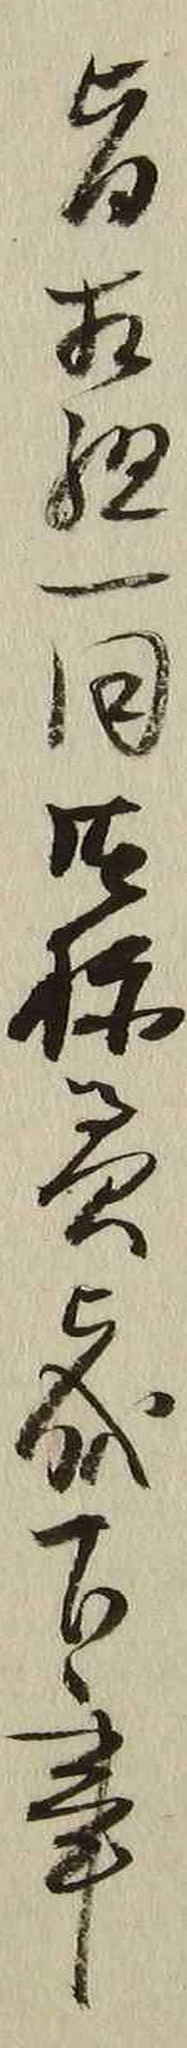旨相組一同御称美被成下候事
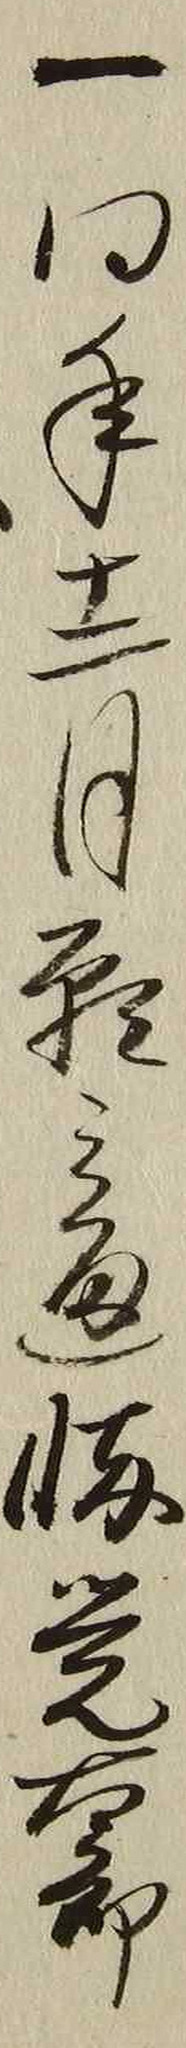一同年十二月願之通忰覚太郎
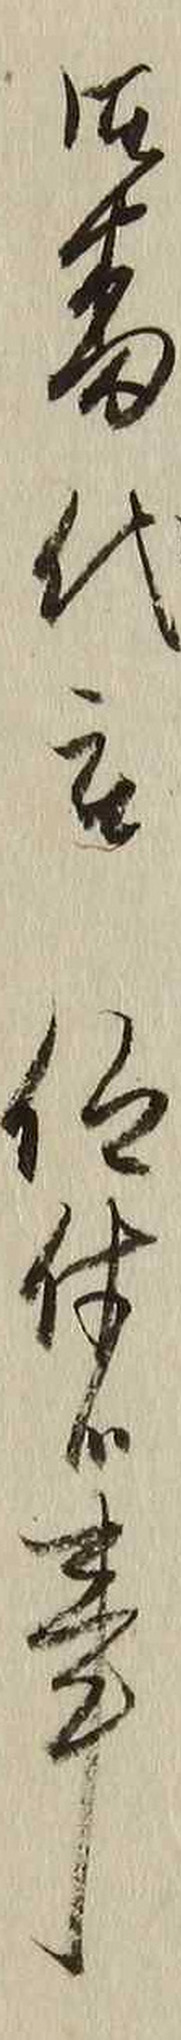御番代被仰付候事
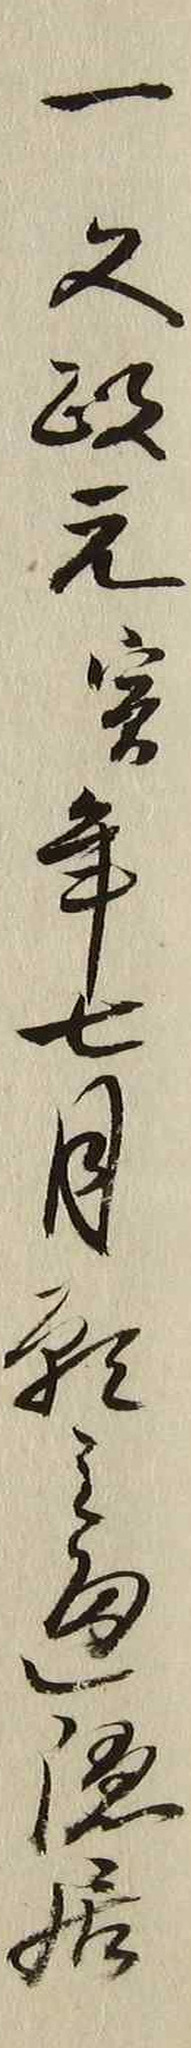一文政元寅年七月願之通隠居
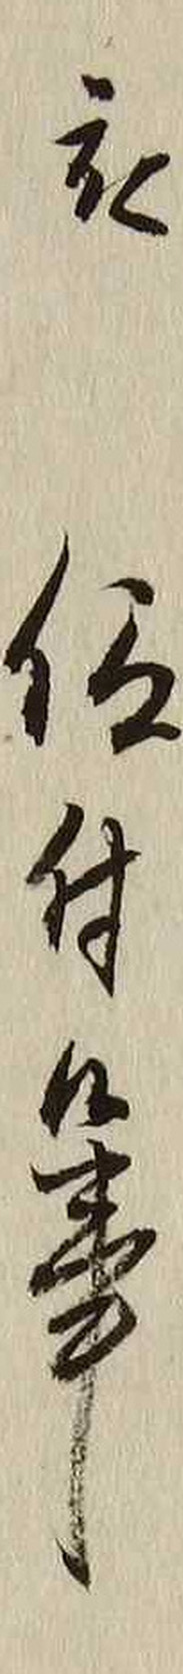被仰付候事
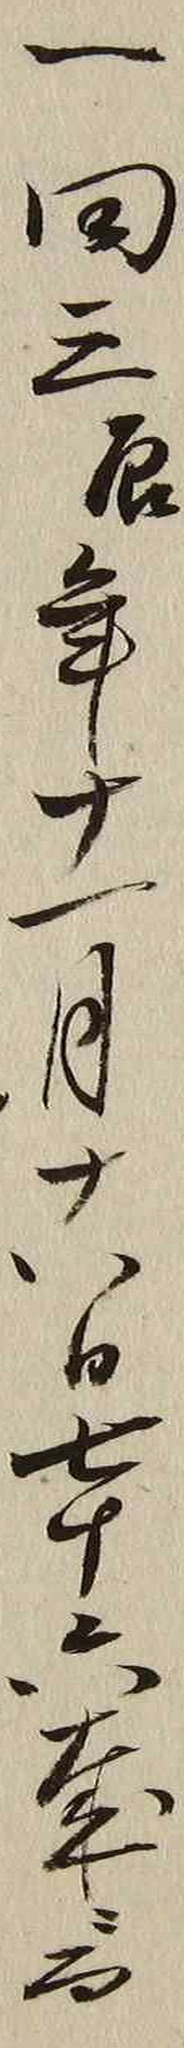一同三辰年十一月十八日七十六歳ニ而
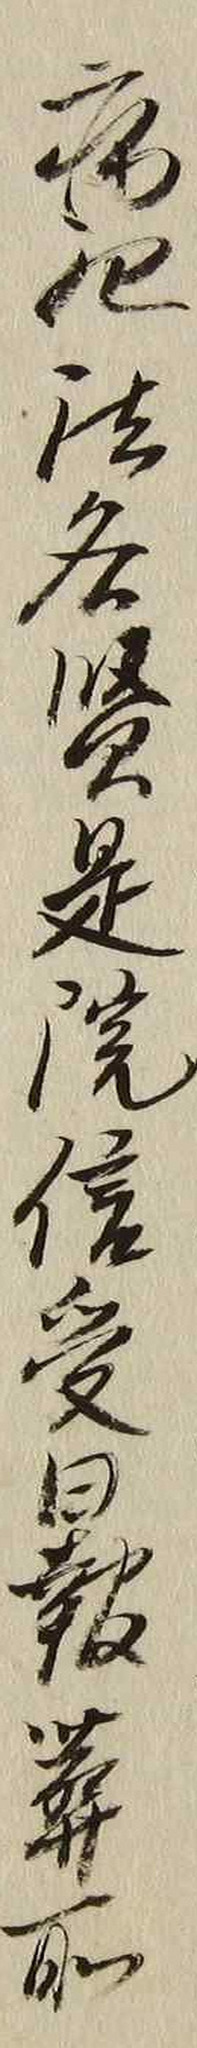病死法名賢是院信受日報葬所
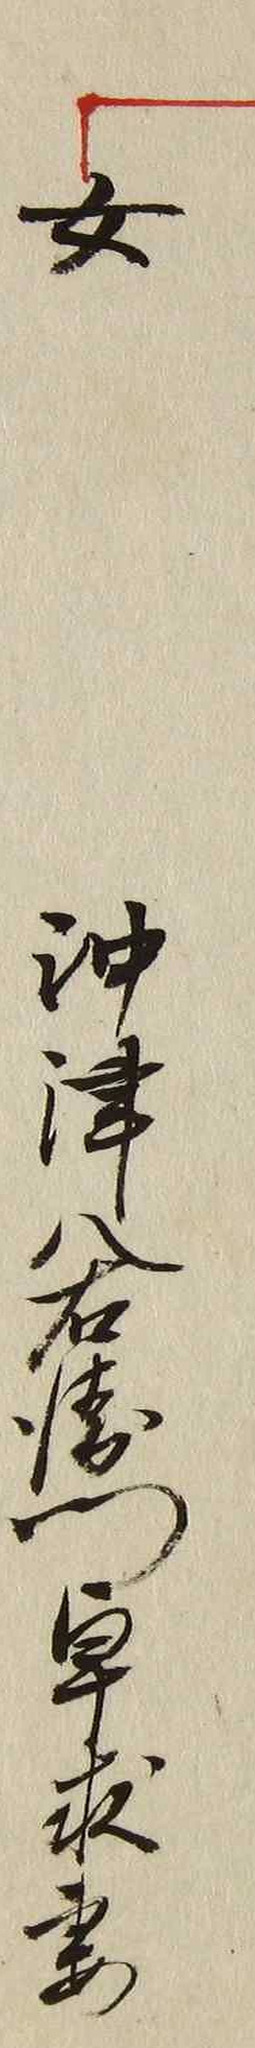女沖津八右衛門卓求妻
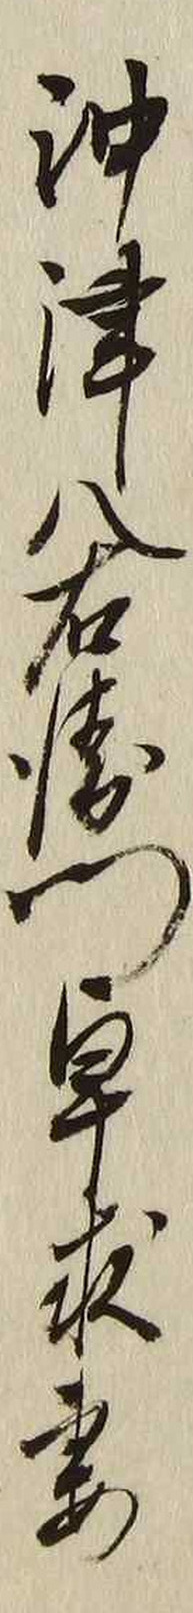女沖津八右衛門卓求妻
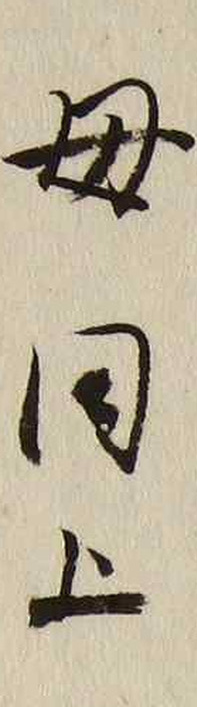母同上

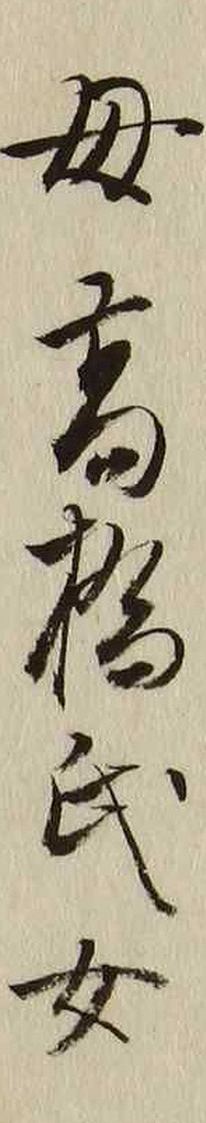母高橋氏女
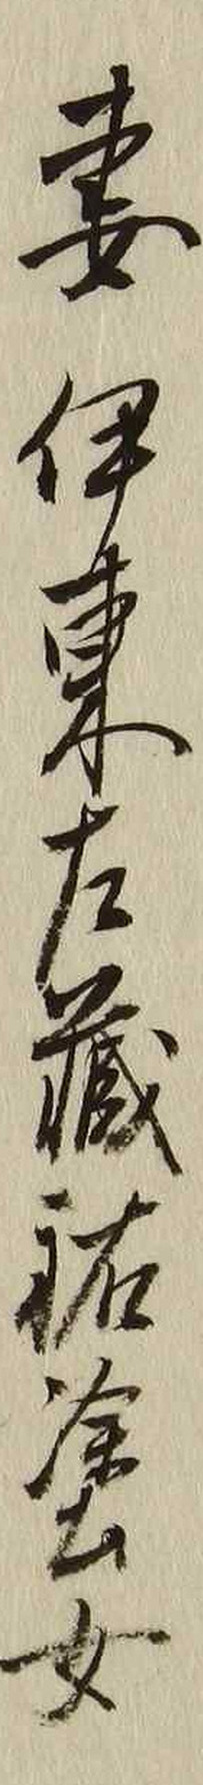妻伊東左蔵祐塗女
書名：諸士系譜　巻之352　す之部2
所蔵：会津若松市立会津図書館
